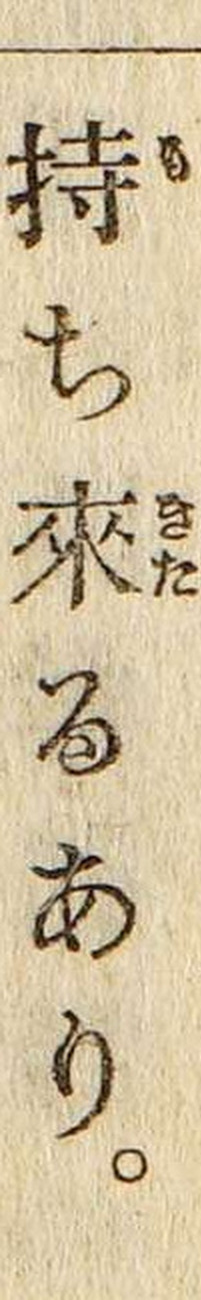持ち來るあり。
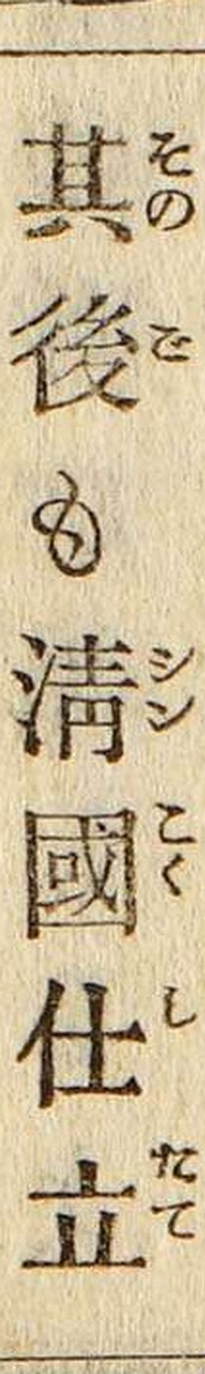其後も清国仕立
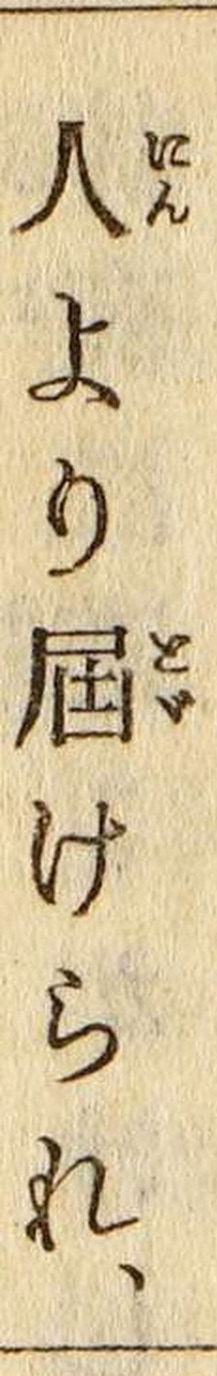人より届けられ、
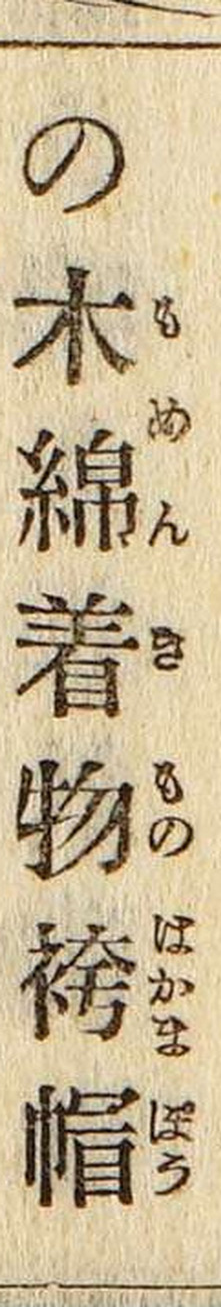の木綿着物袴帽
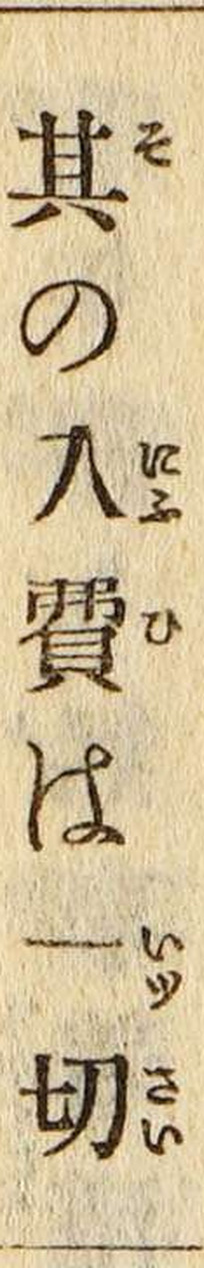其の入費は一切
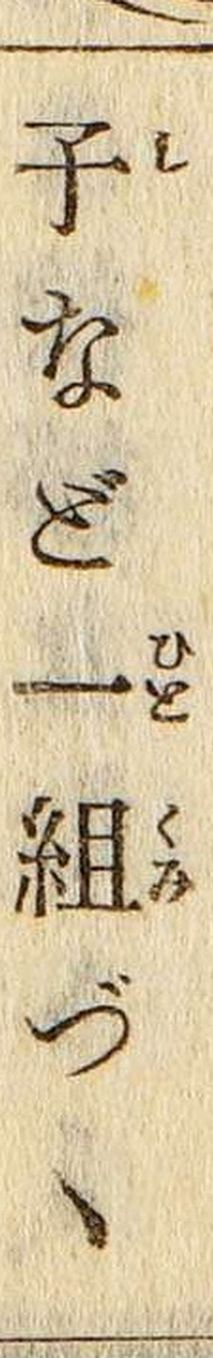子など一組づヽ
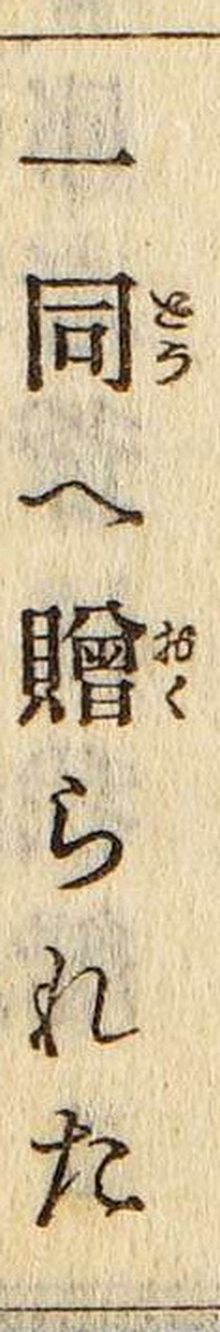一同へ贈られた
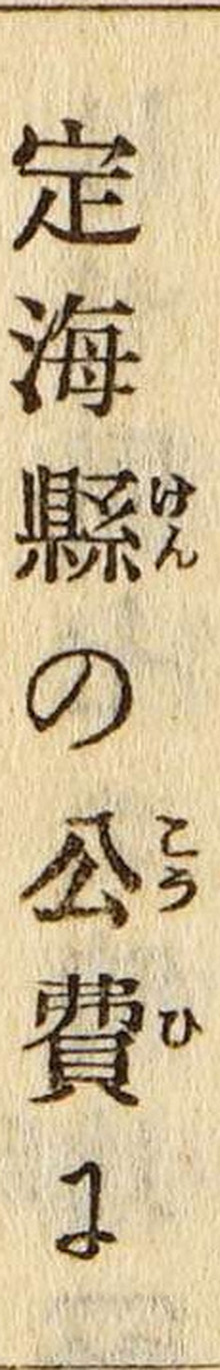定海県の公費に
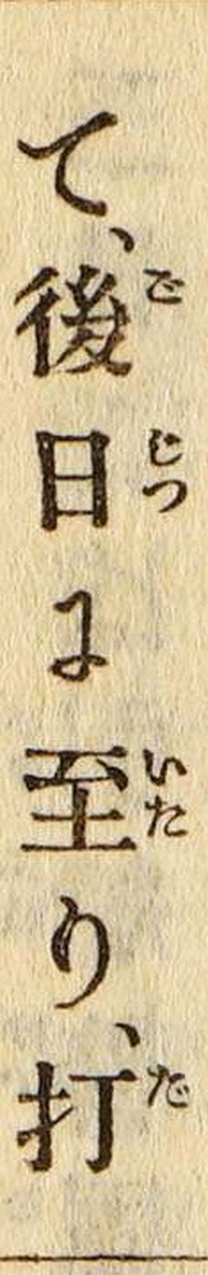て後日に至り、打
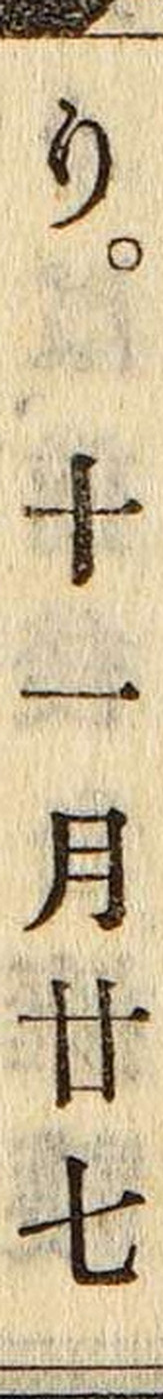り。十一月廿七
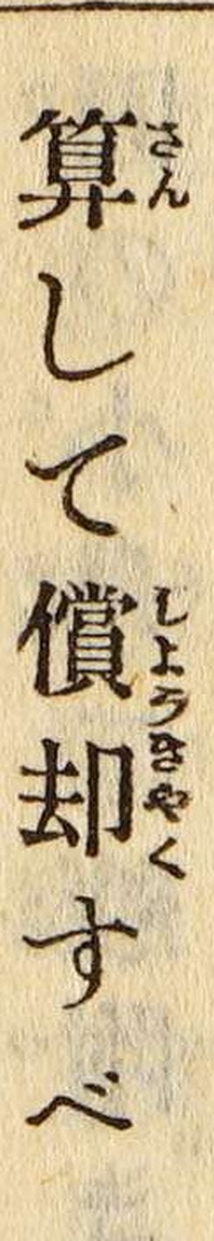算して償却すべ
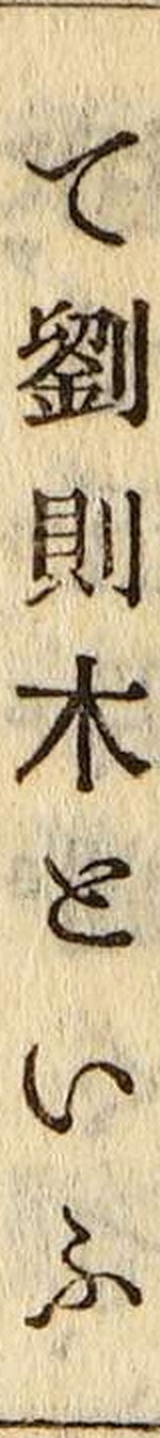て劉則木といふ
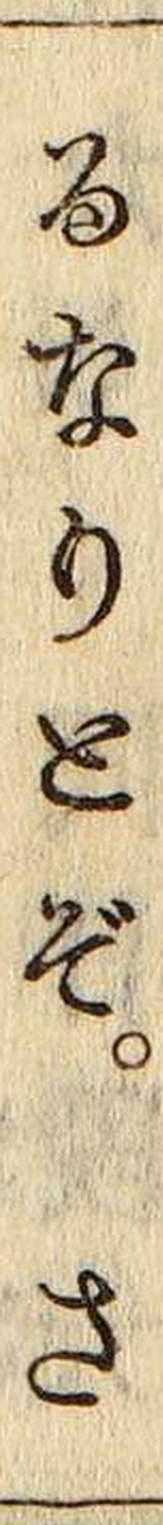るなりとぞ。さ
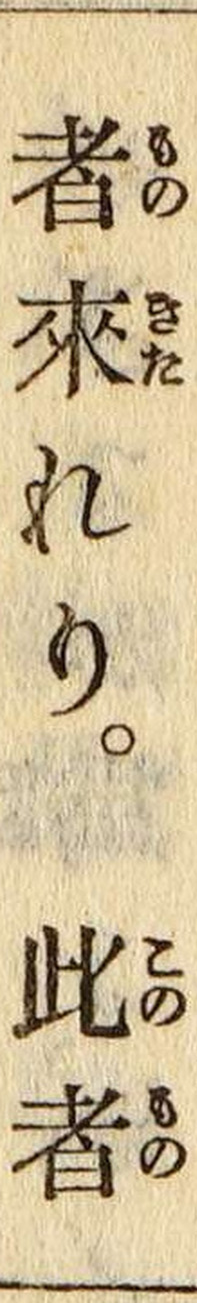者来れり。此者は
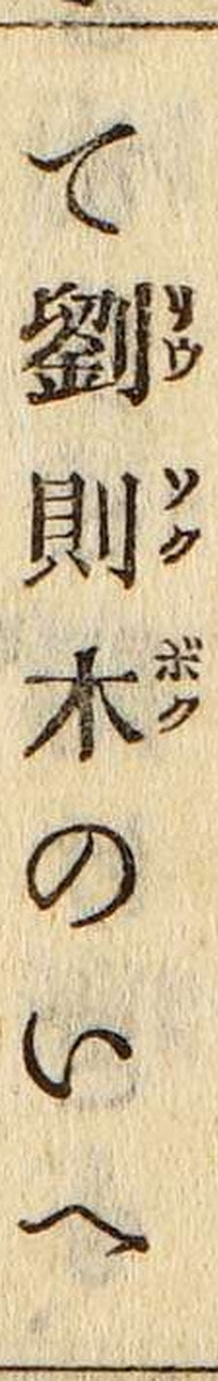て劉則木のいへ
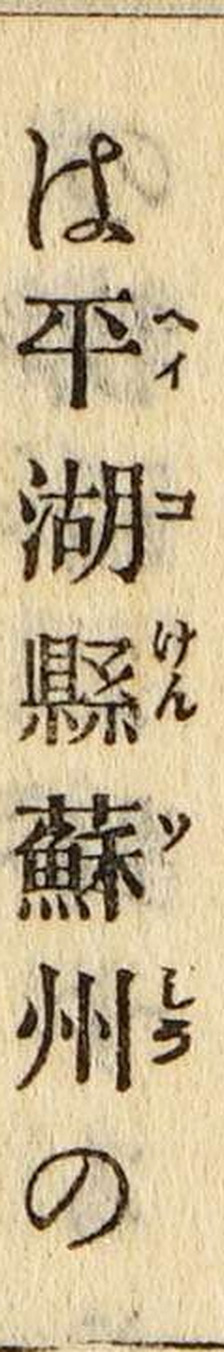平湖県蘇州の
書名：日本漂流譚
